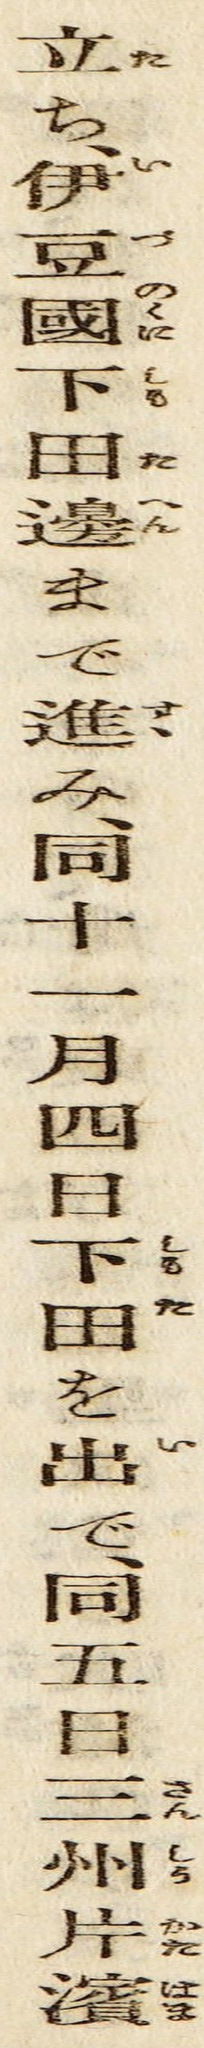立ち、伊豆国下田辺まで進み、同十一月四日下田を出で、同五日三州片浜
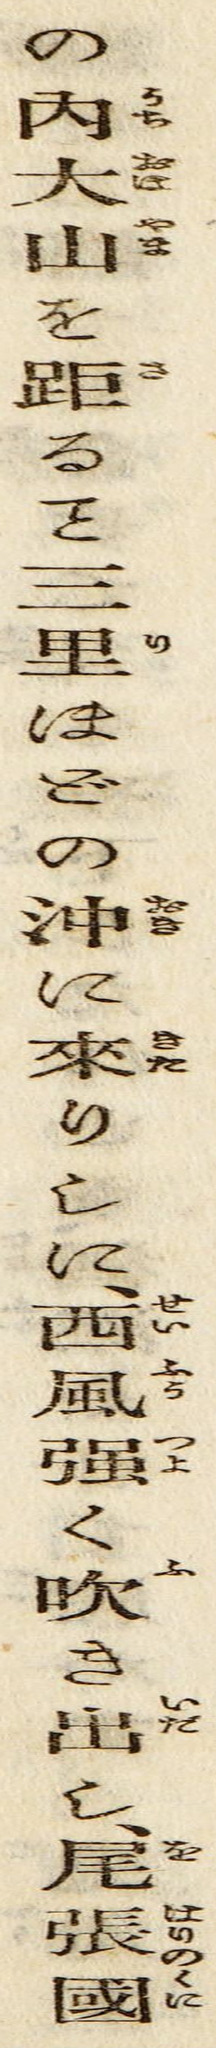の内大山を距ること三里ほどの沖に来りしに、西風強く吹き出し、尾張国
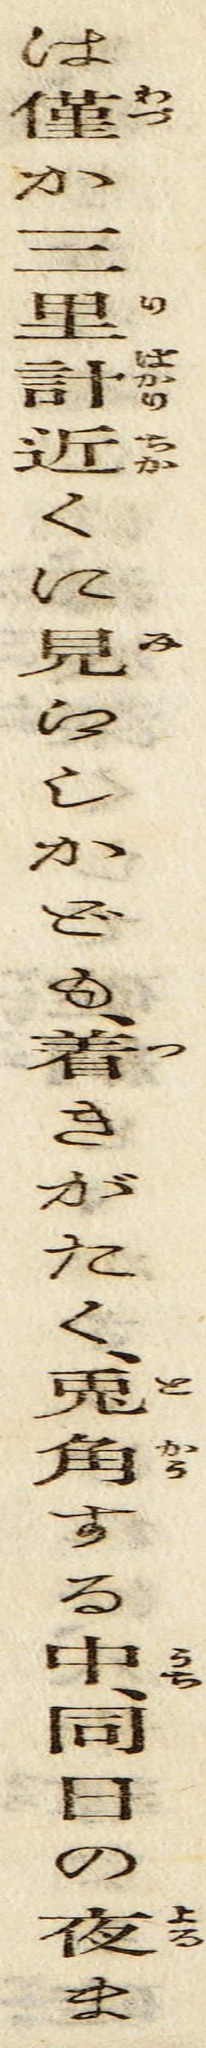は僅か三里計近くに見えしかども、着きがたく、兎角する中、同日の夜ま
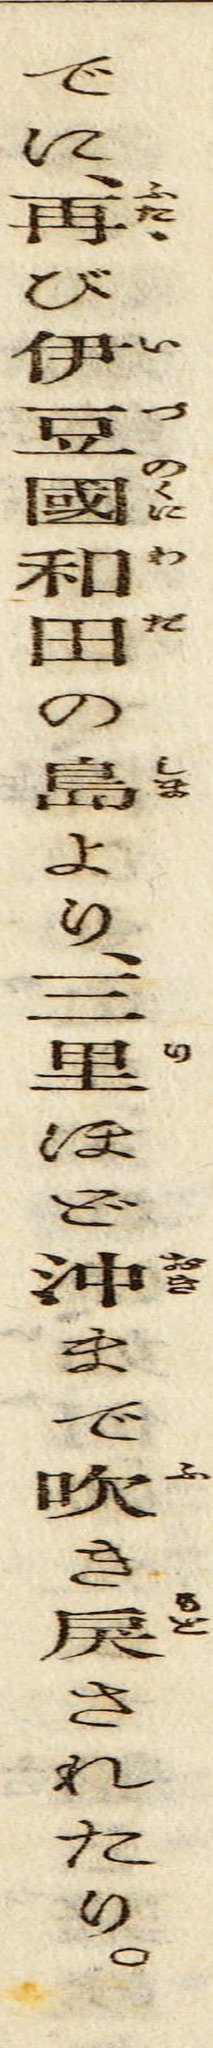でに、再び伊豆国和田の島より、三里ほど沖まで吹き戻されたり。

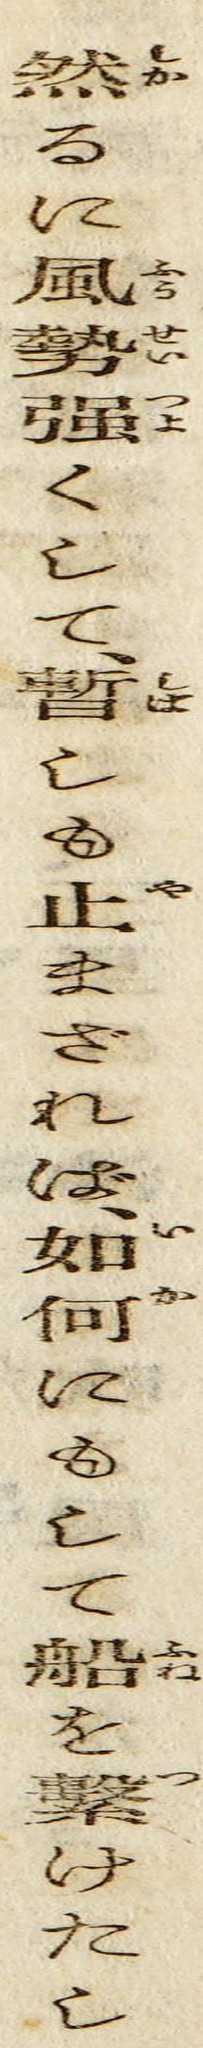然るに風勢強くして、暫しも止まざれば、如何にもして船を繋けたし
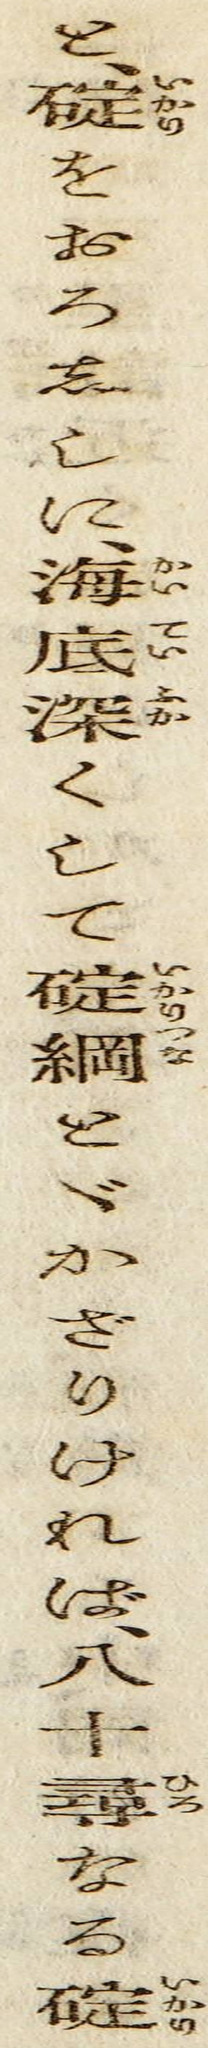と、碇をおろししに、海底深くして碇綱とヾかざりければ、八十尋なる碇
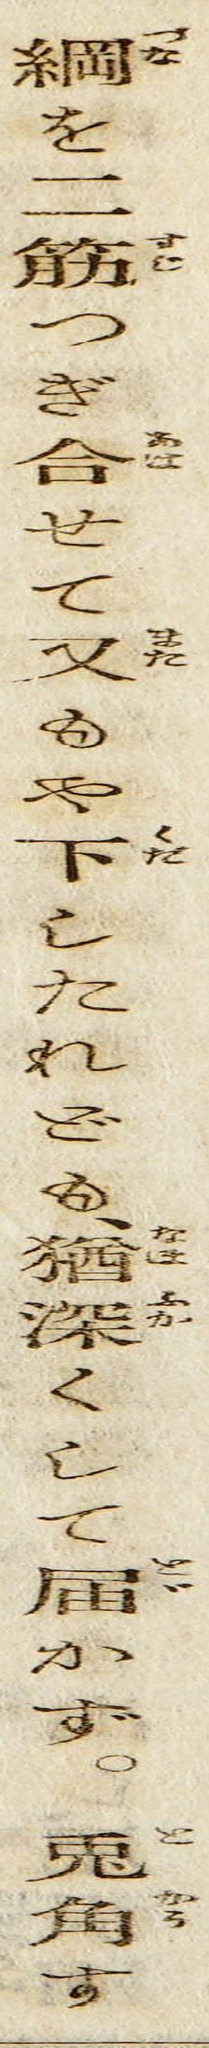綱を二筋つぎ合せて又もや下したれども、猶深くして届かず。兎角す
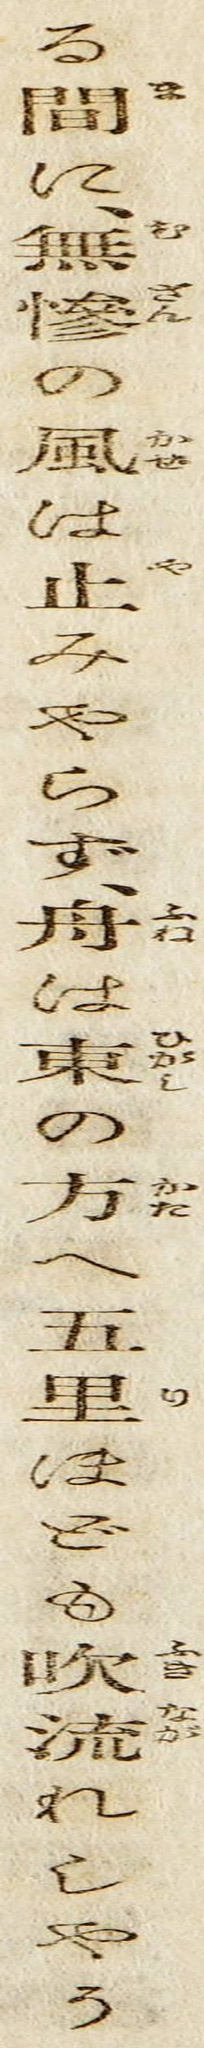る間に、無惨の風は止みやらず、舟は東の方へ五里ほども吹流れしやう
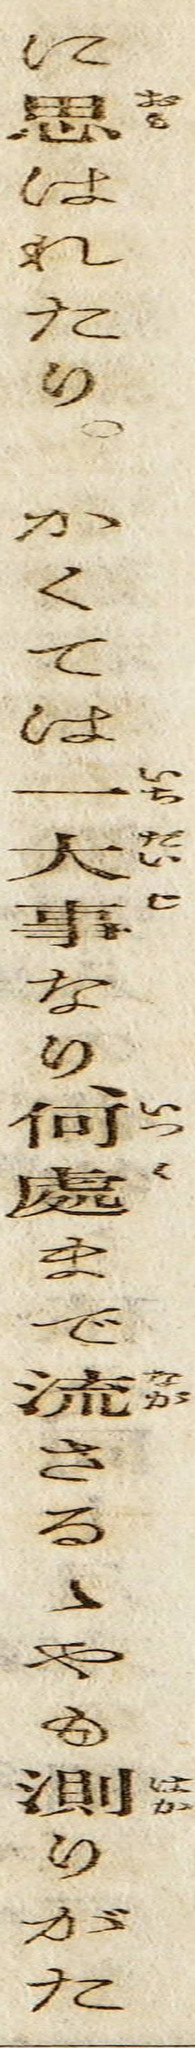に思はれたり。かくては一大事なり、何処まで流さるゝやも測りがた
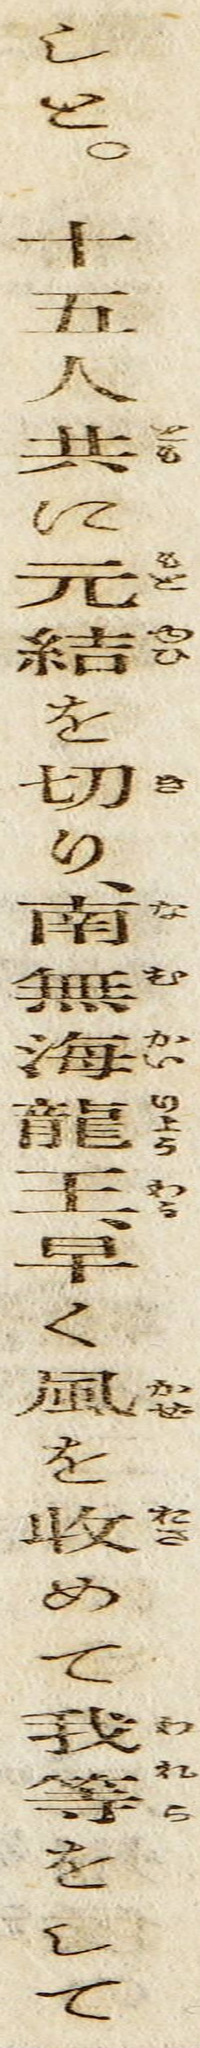しと。十五人共に元結を切り、南無海竜王、早く風を収めて我等をして
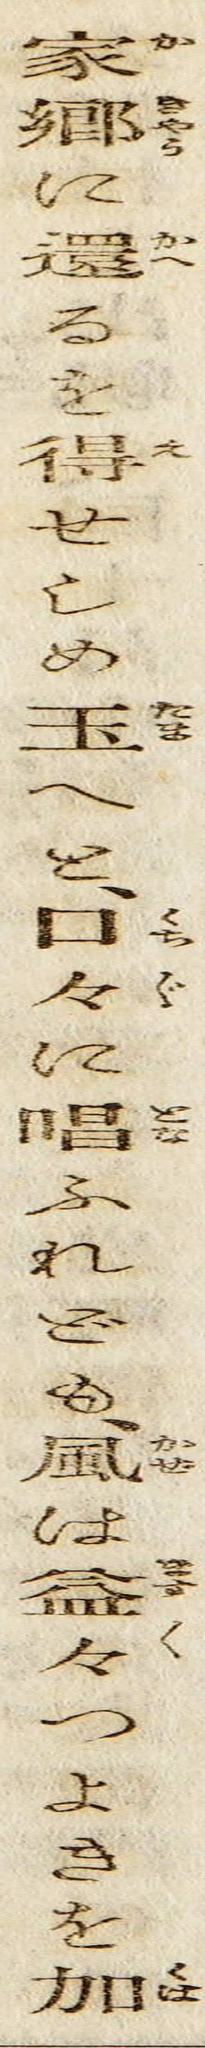家郷に還るを得せしめ玉へと、口々に唱ふれども、風は益々つよきを加
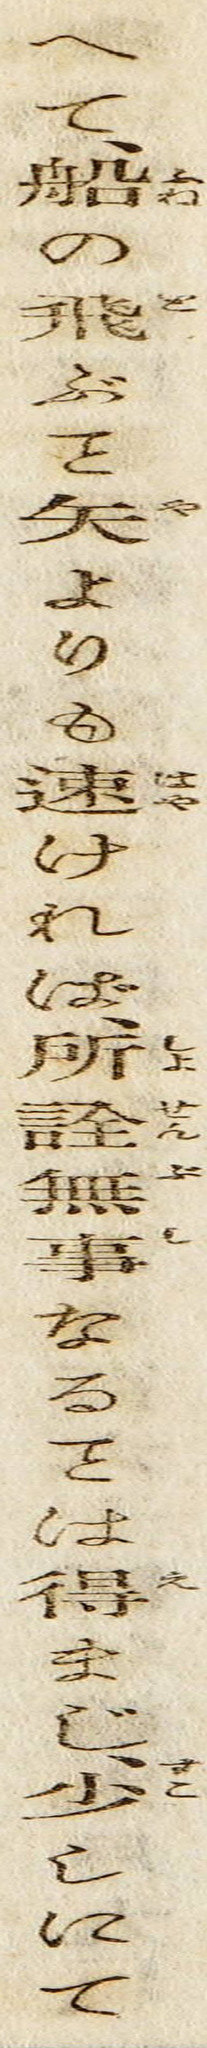へて、船の飛ぶこと矢よりも速ければ、所詮無事なることは得まじ、少しにて
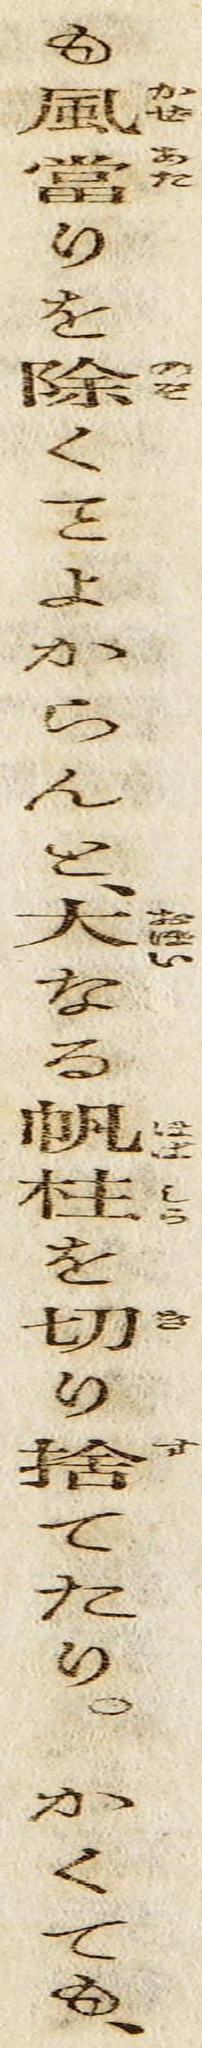も風当りを除くことよからんと、大なる帆柱に切り捨てたり。かくても、
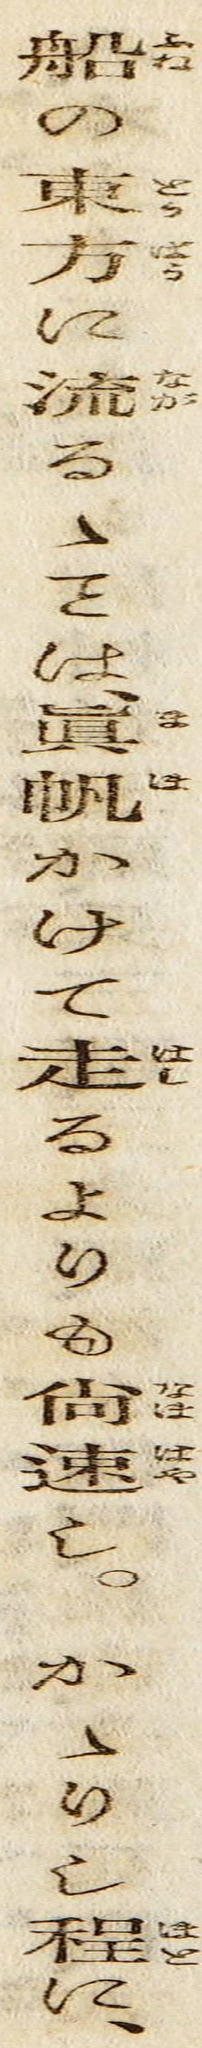船の東方に流るゝことは、真帆かけて走るよりも尚速し。かゝりし程に、
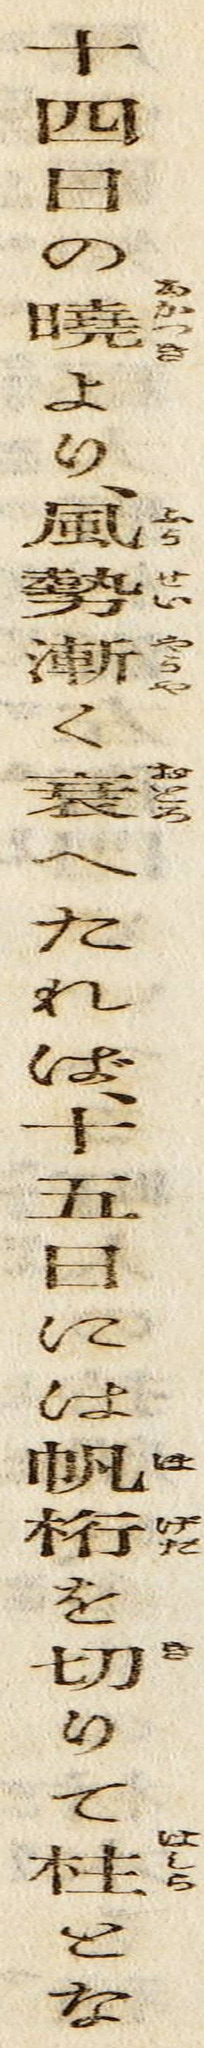十四日の暁より、風勢漸く衰へたれば、十五日には帆桁を切りて柱とな
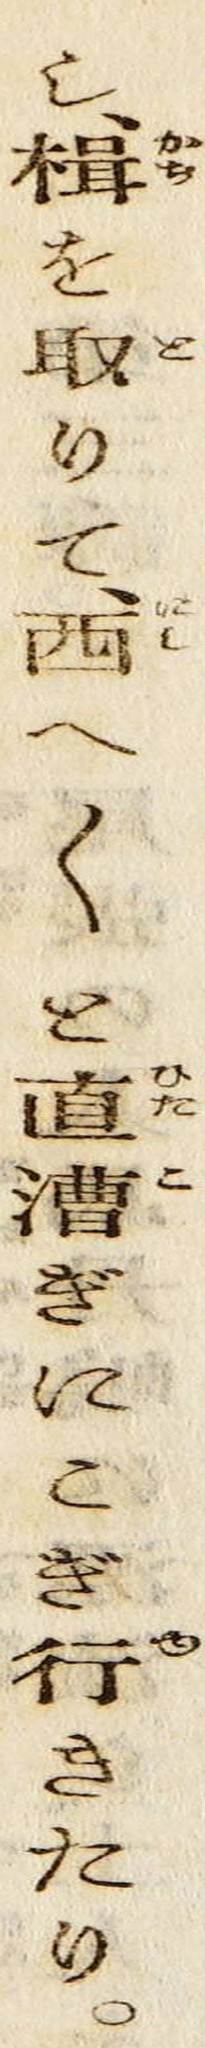し、楫を取りて、西へ〳〵と直漕ぎにこぎ行きたり。
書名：日本漂流譚
